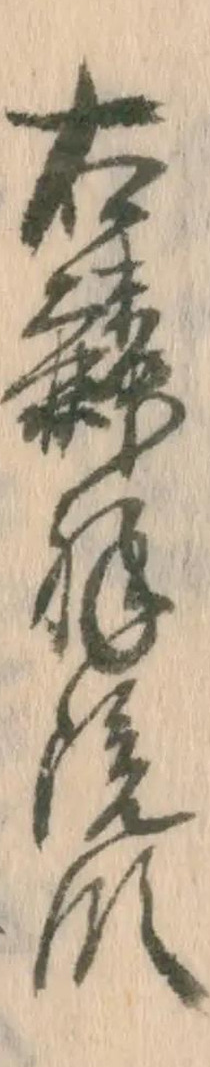右麟祥院領
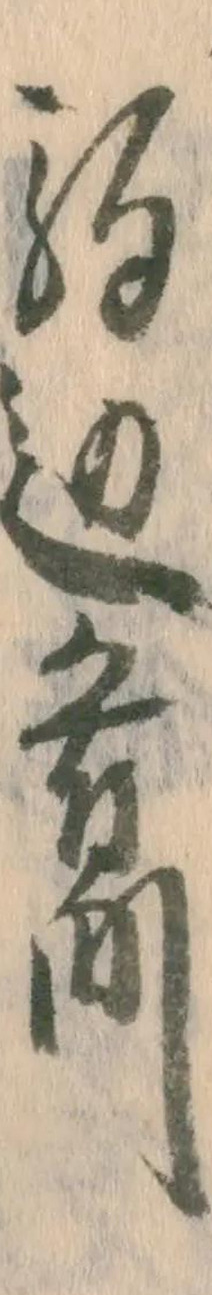駒込片町
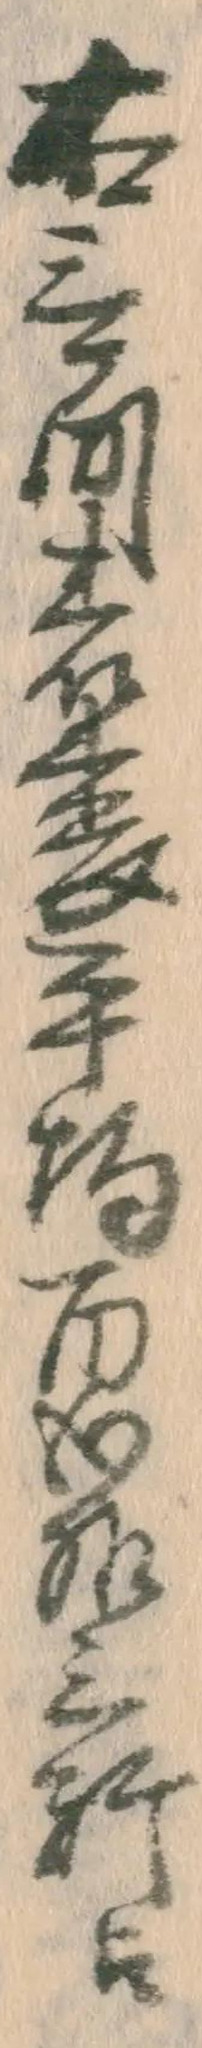右三ケ町裏表平均百弐拾三軒え
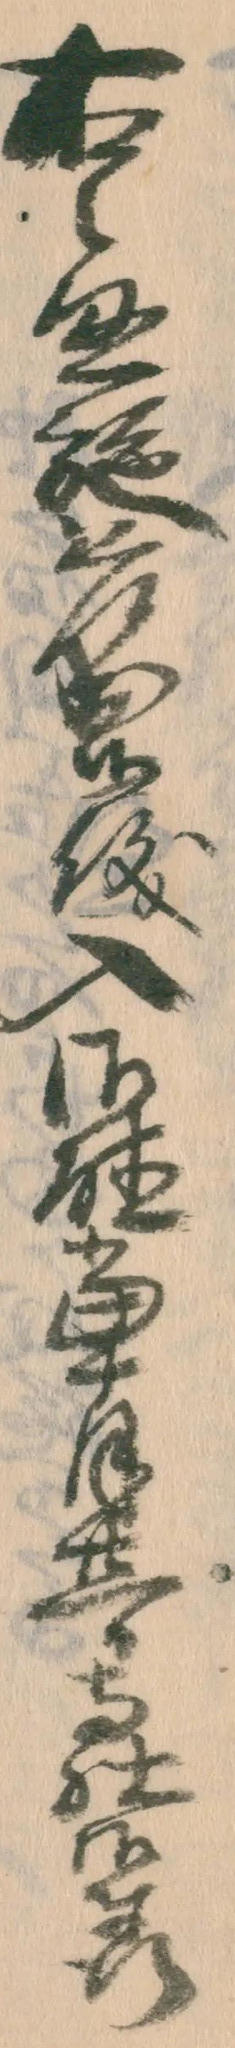右之通施差出候儀入御聴当十月廿一日寺社御奉行
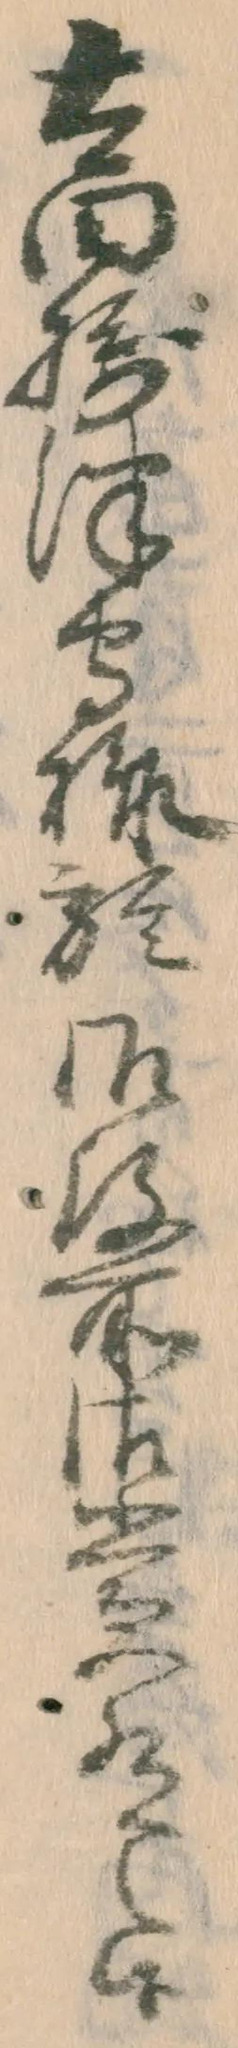太田摂津守様於御役所御賞有之候
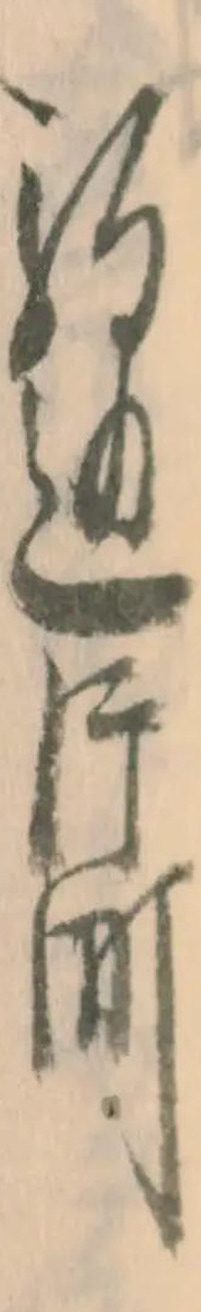駒込片町
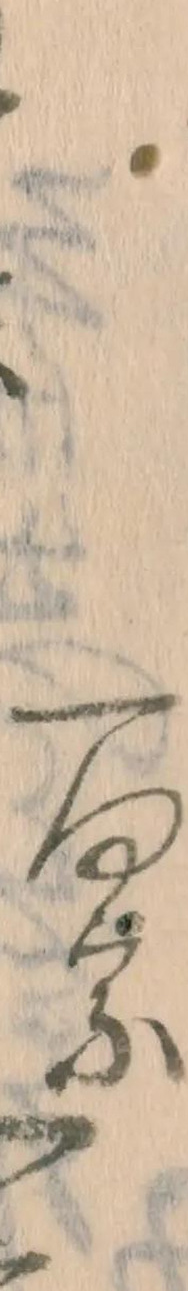一向宗
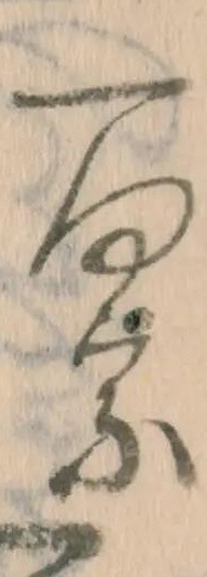一向宗
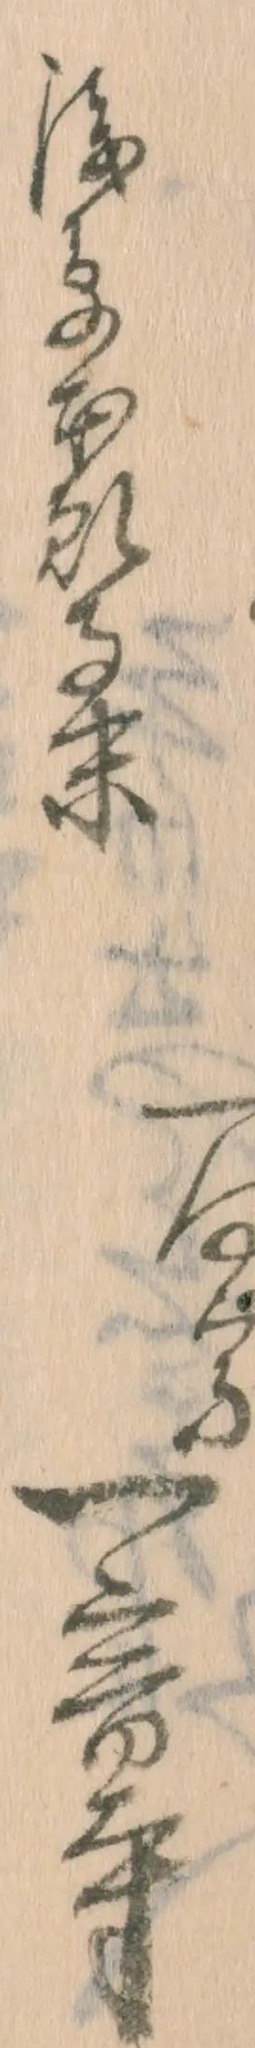浅草本願寺末一音寺
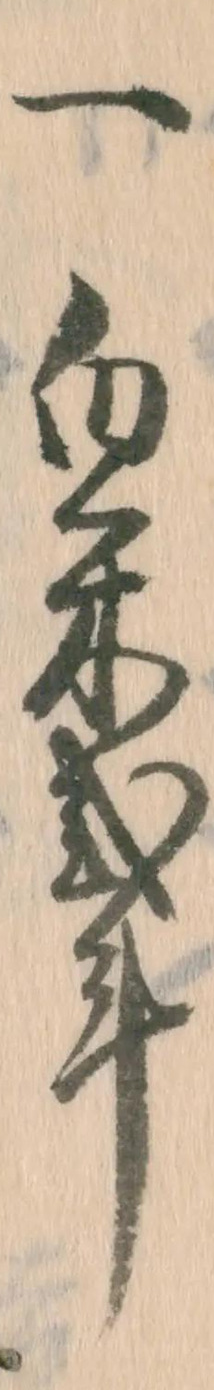一白米弐斗
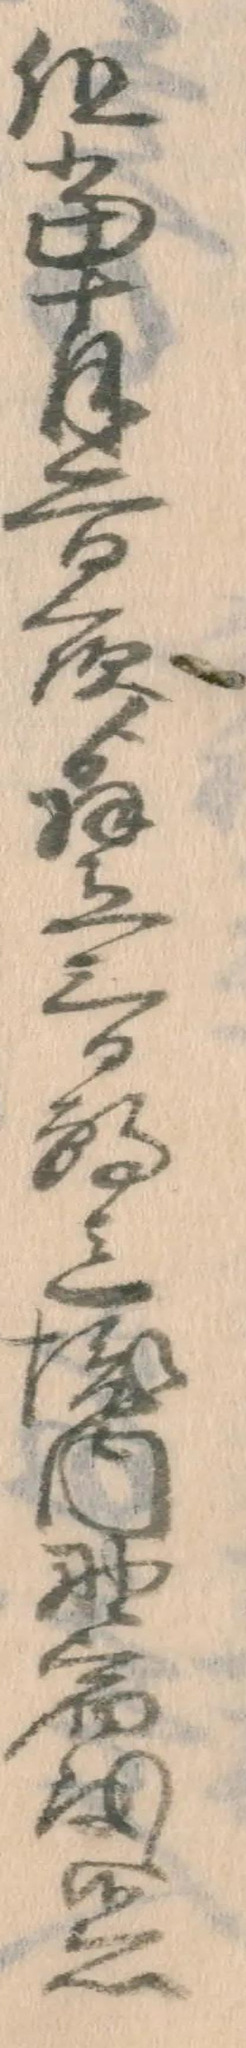但当十月二日夜ゟ翌三日朝迄境内野宿致候者
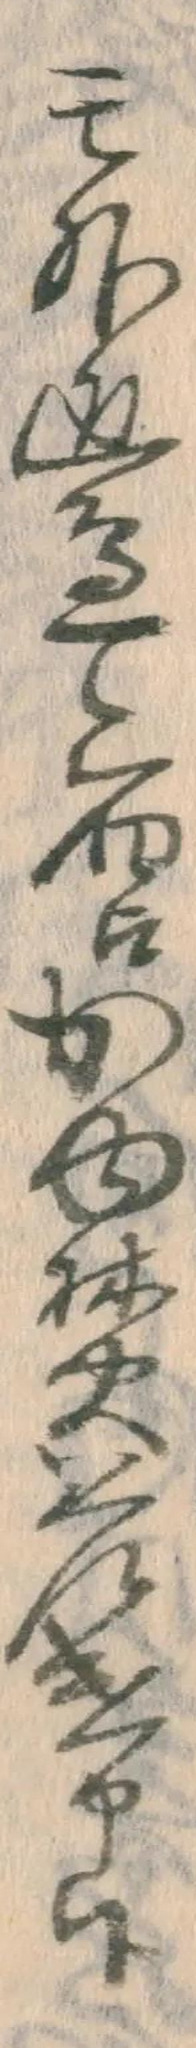其外近辺之者えかゆ焚差遣申候
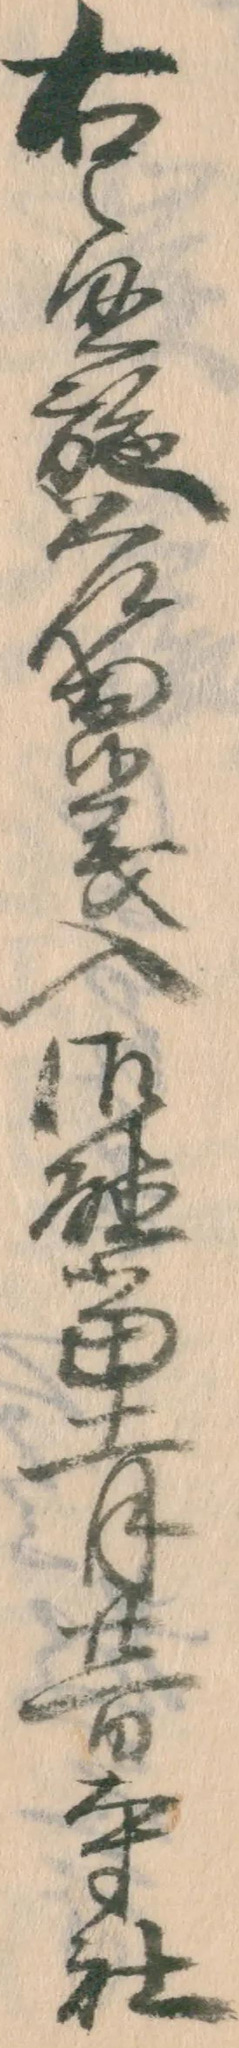右之通施差出候義入御聴当十一月廿一日寺社
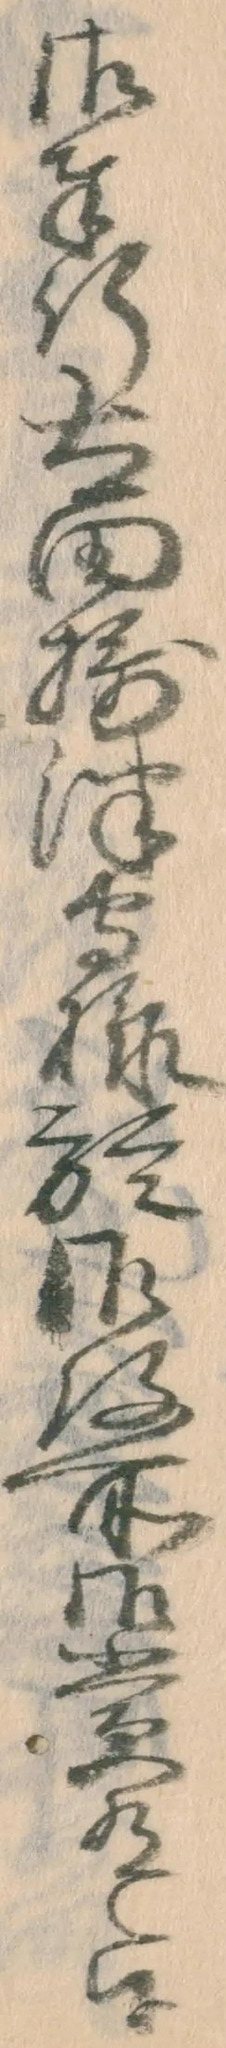御奉行太田摂津守様於御役所御賞有之候

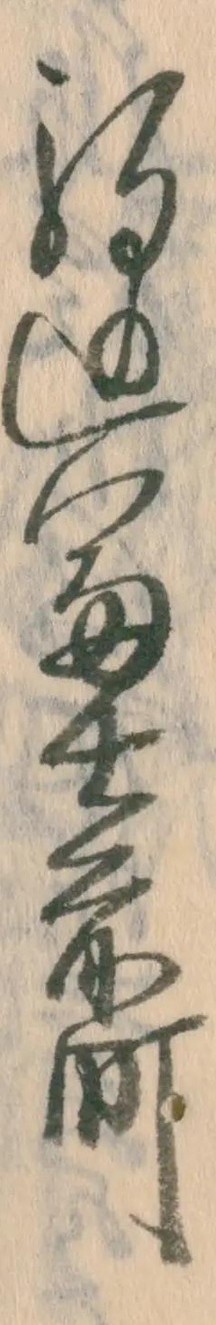駒込冨士前町
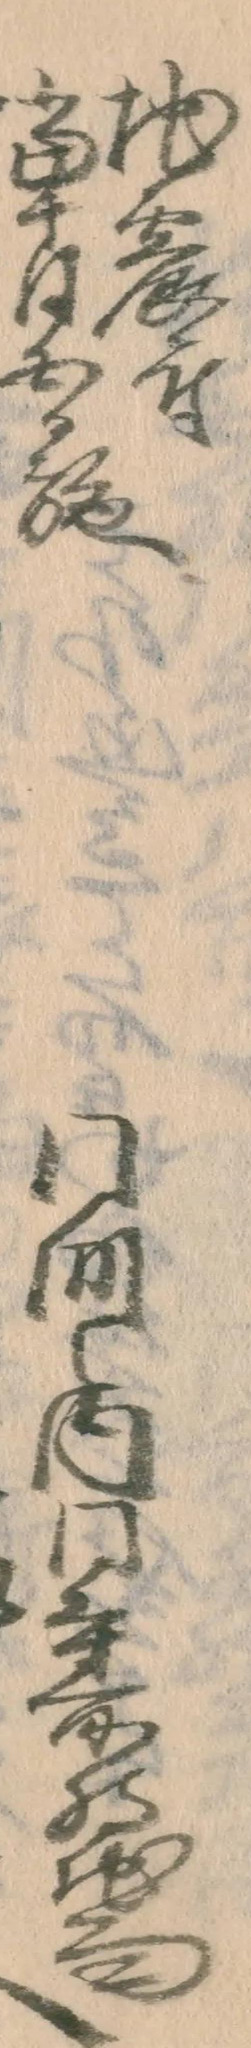当十月五日施同町之内同寺所持地面
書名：武家方并寺院等ニテ施差出候一件
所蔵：国立国会図書館 National Diet Library, JAPAN
